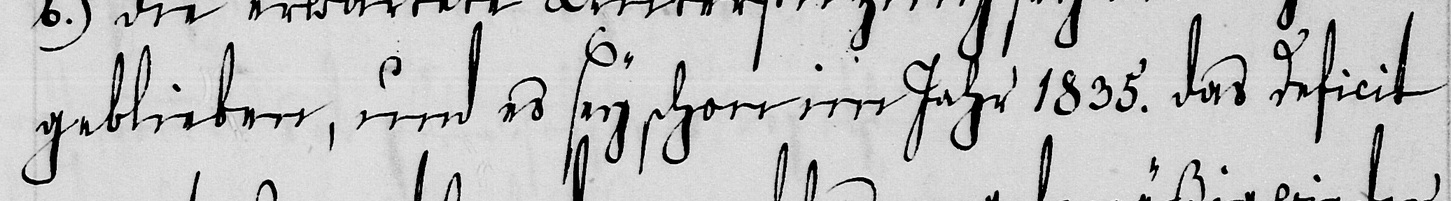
geblieben, und es sey schon im Jahr 1835. das Deficit
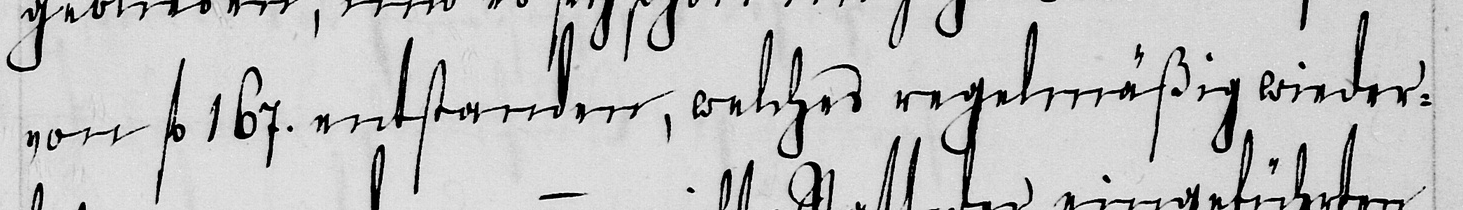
von fl. 167. entstanden, welches regelmäßig wieder¬
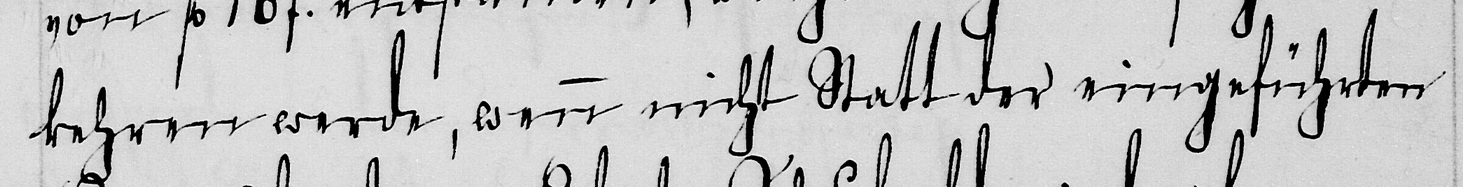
kehren werde, wenn nicht Statt der eingeführten
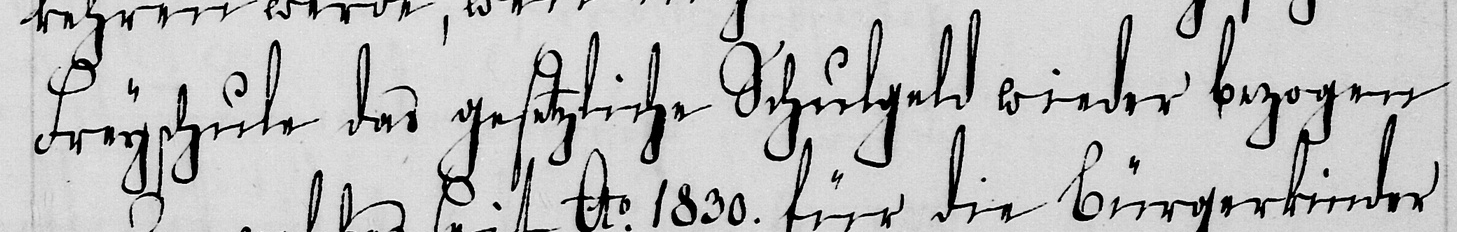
Freyschule das gesetzliche Schulgeld wieder bezogen
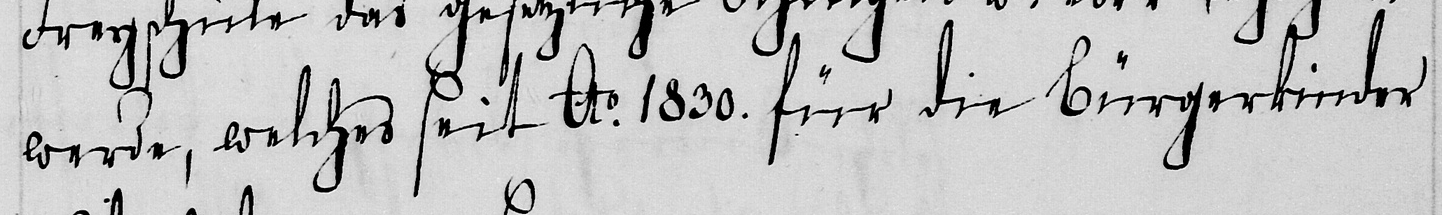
werde, welches seit Ao. 1830. für die Bürgerkinder
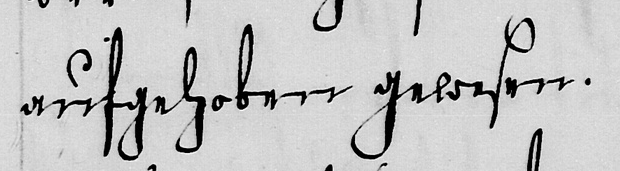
aufgehoben gewesen.
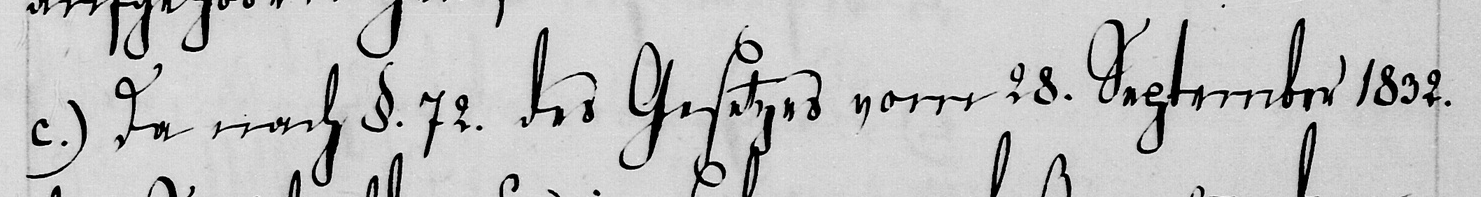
c.) Da nach §. 72. des Gesetzes vom 28. September 1832.
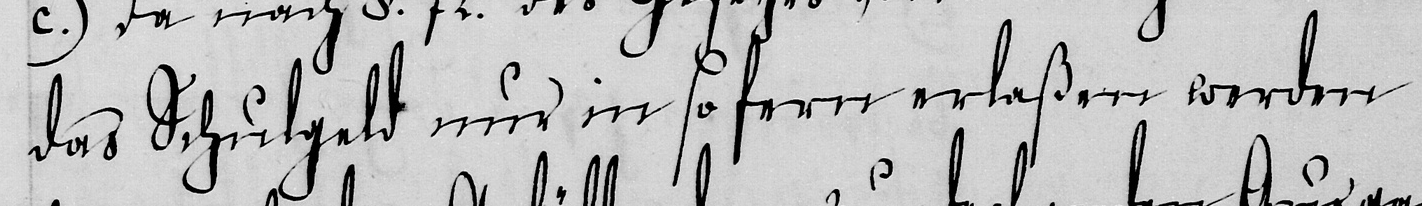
das Schulgeld nur in so fern erlaßen werden
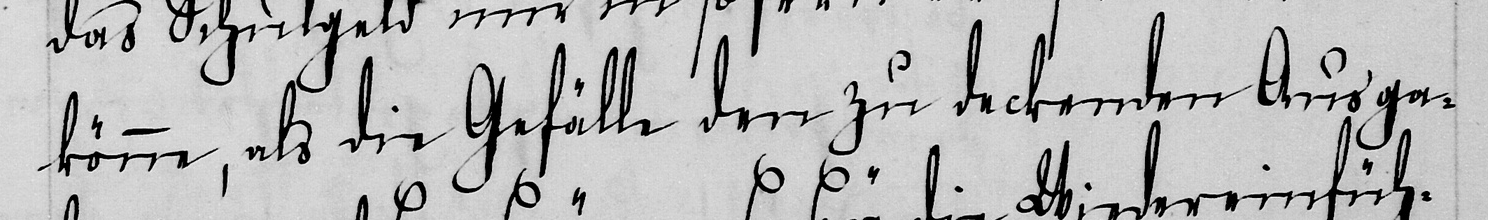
könne, als die Gefälle den zu deckenden Ausga¬
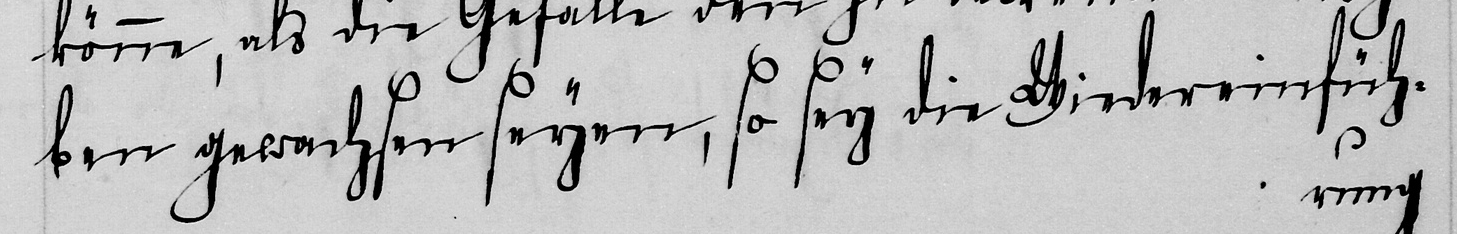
ben gewachsen seyen, so sey die Wiedereinfüh-
